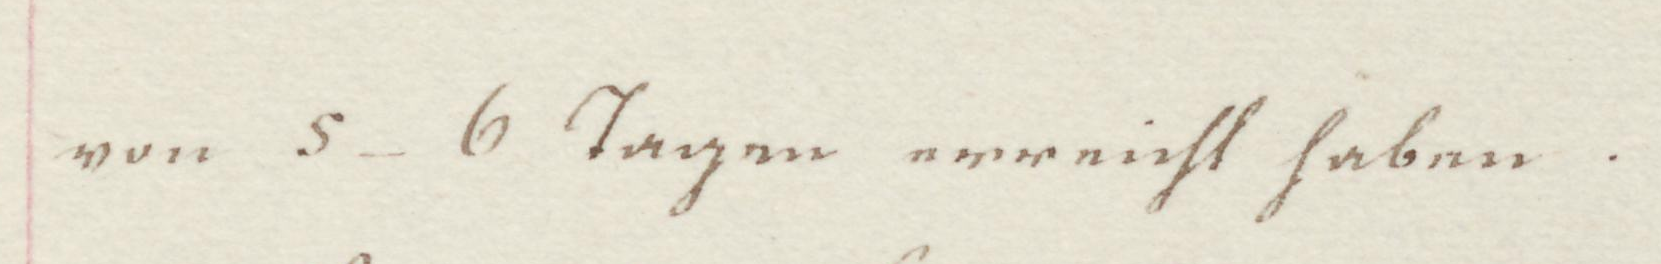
von 5–6 Tagen erreicht haben.
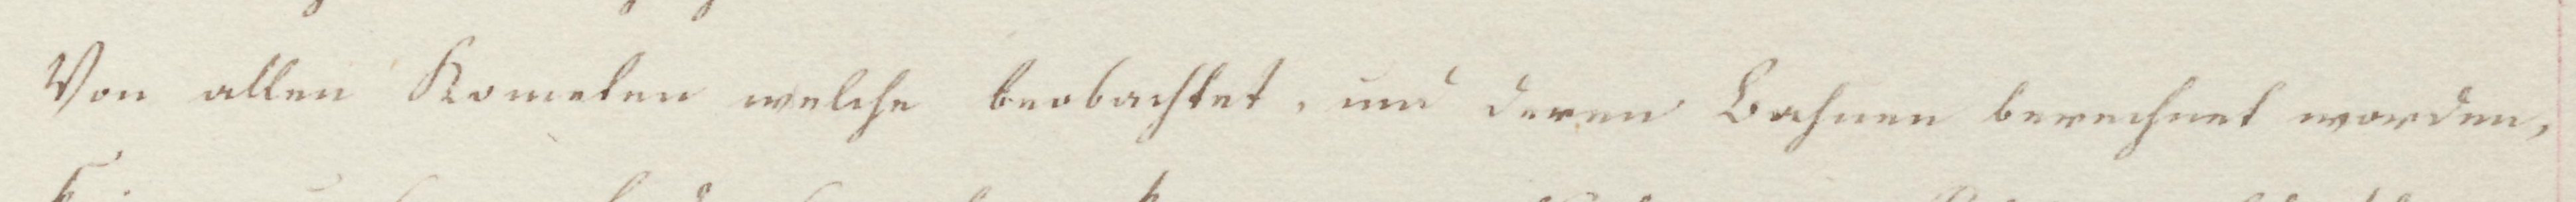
Von allen Kometen welche beobachtet, und deren Bahnen berechnet worden,
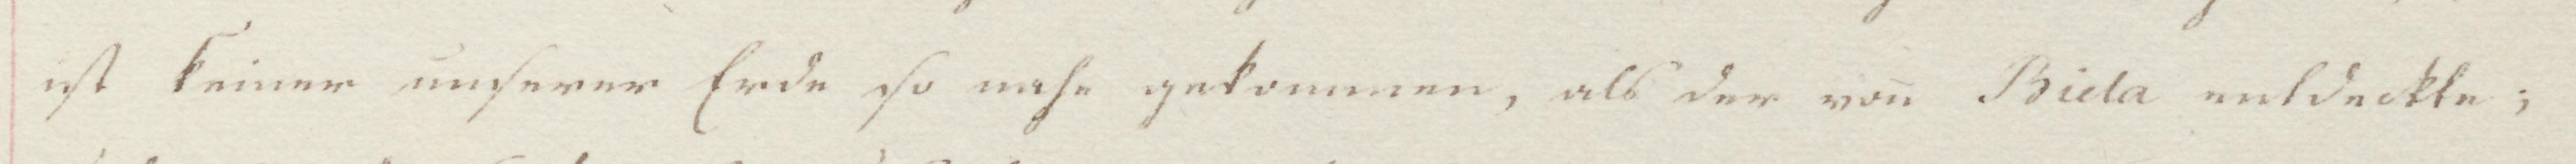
ist keiner unserer Erde so nahe gekommen, als der von Biela entdeckte;
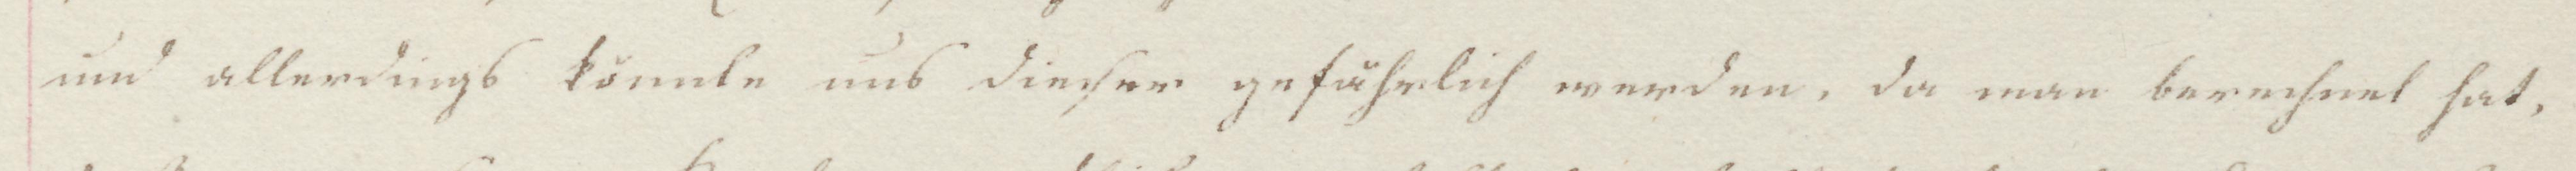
und allerdings könnte uns dieser gefährlich werden, da man berechnet hat,
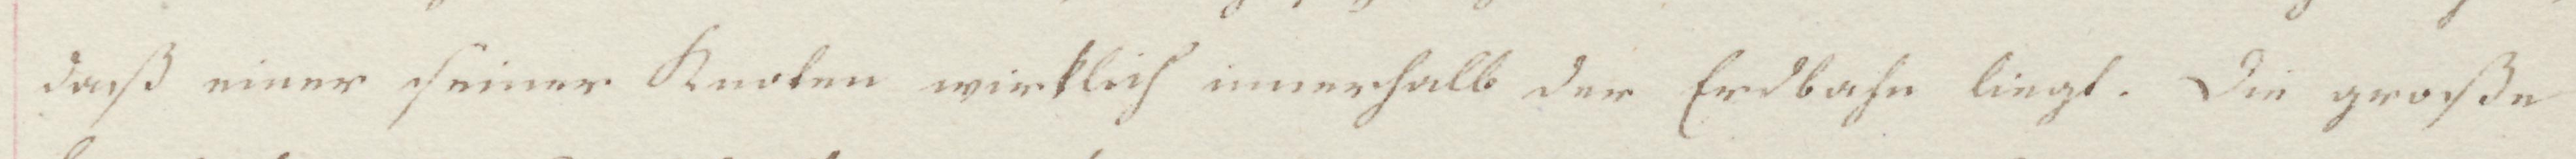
daß einer seiner Knoten wirklich innerhalb der Erdbahn liegt. Die große
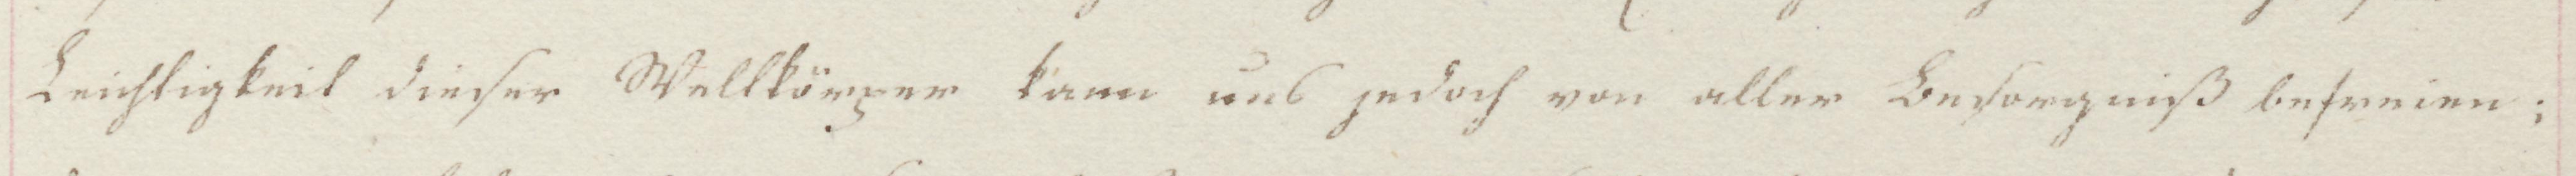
Leichtigkeit dieser Weltkörper kann uns jedoch von aller Besorgniß befreien;
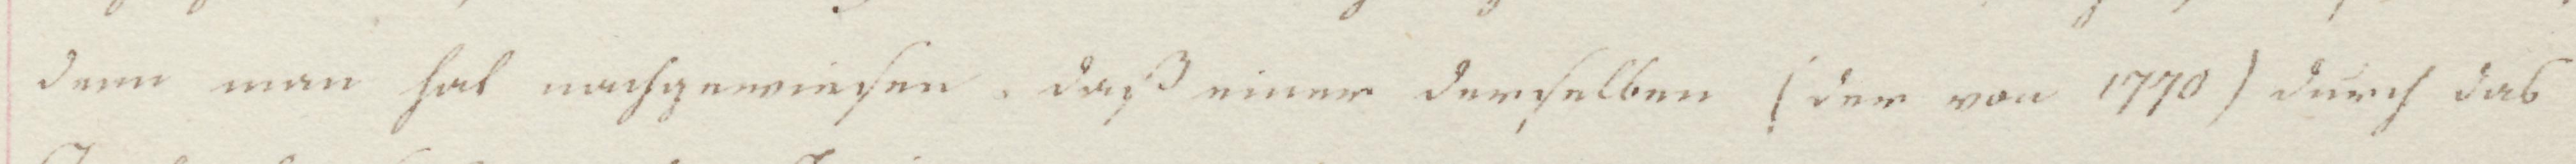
denn man hat nachgewiesen, daß einer derselben durch das
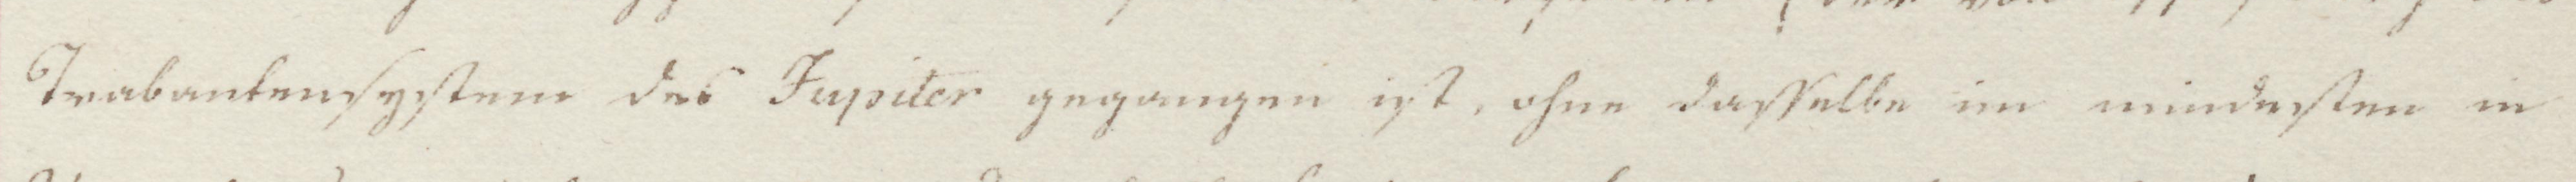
Trabantensystem des Jupiter gegangen ist, ohne dasselbe im mindesten in
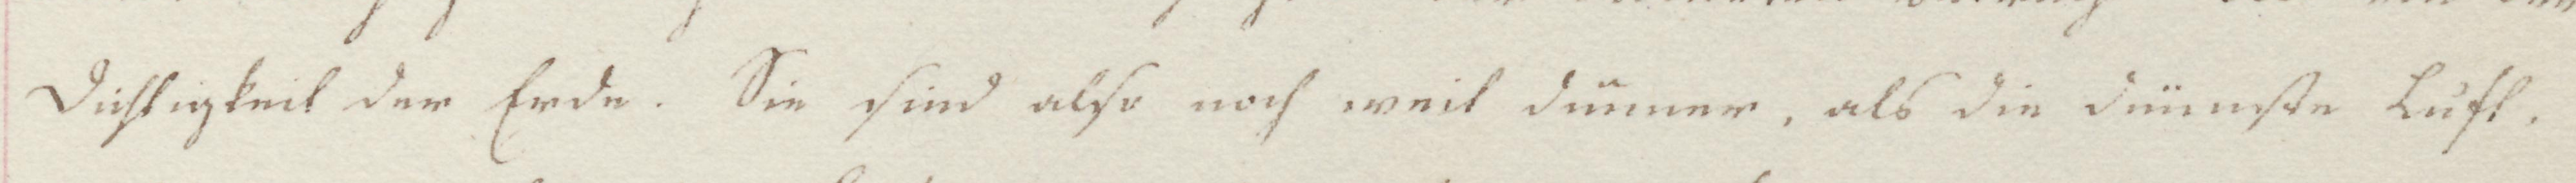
Dichtigkeit der Erde. Sie sind also noch weit dünner, als die dünnste Luft,
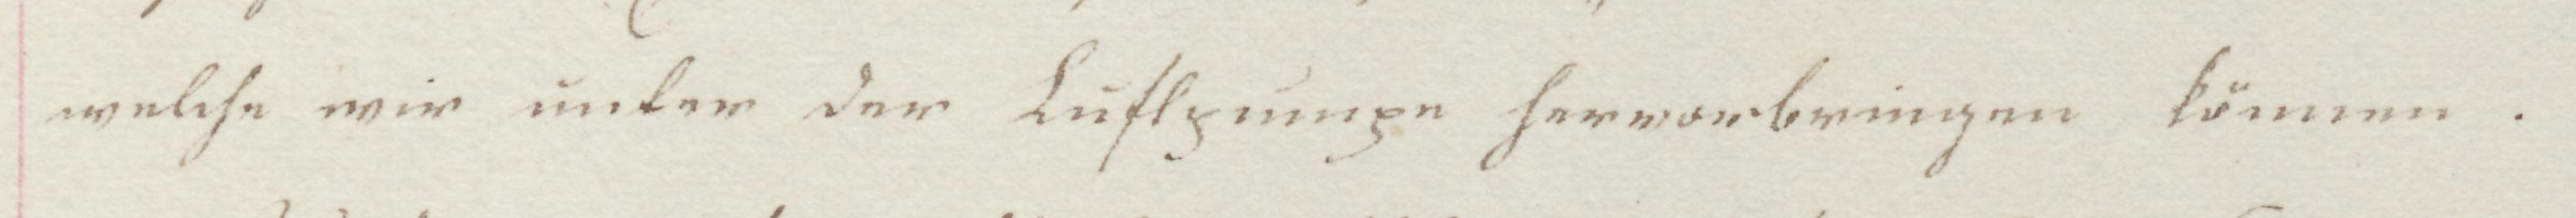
welche wir unter der Luftpumpe hervorbringen können.
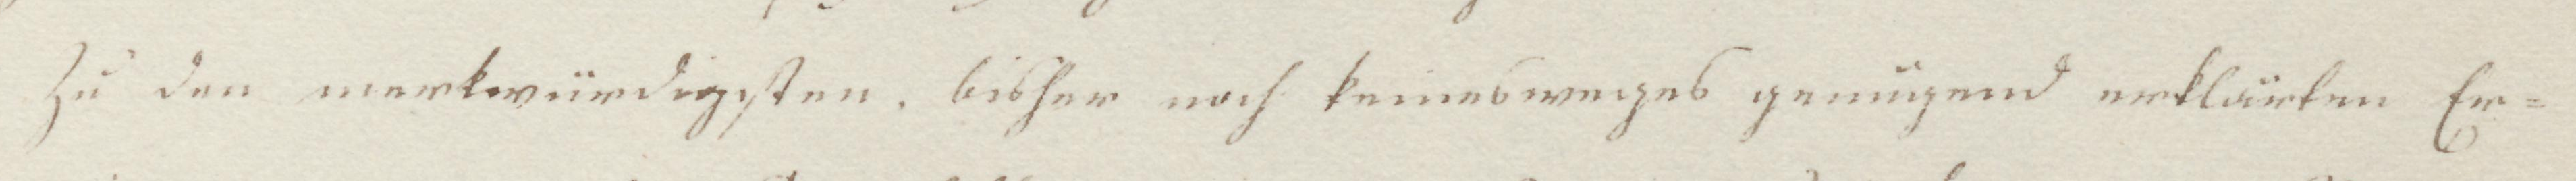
Zu den merkwürdigsten, bisher noch keineswegs genügend erklärten Er-
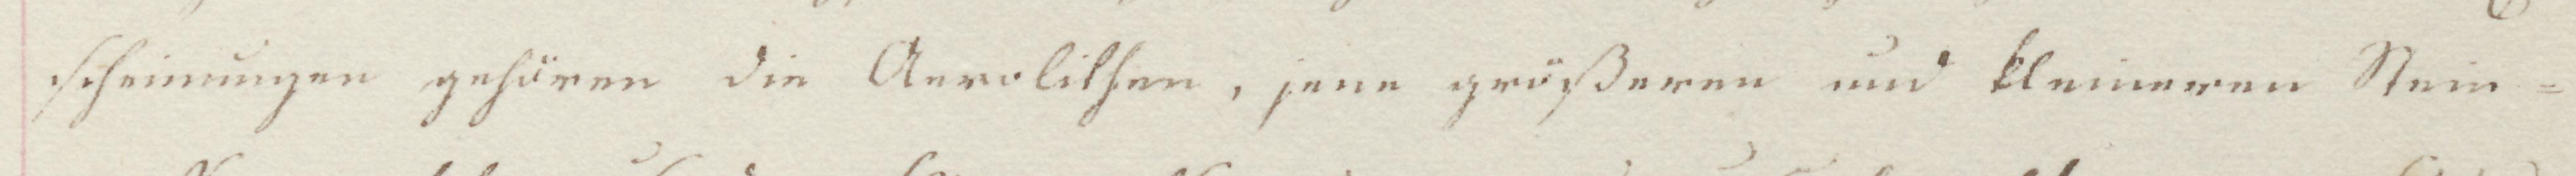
scheinungen gehören die Aerolithen, jene größeren und kleineren Stein-
